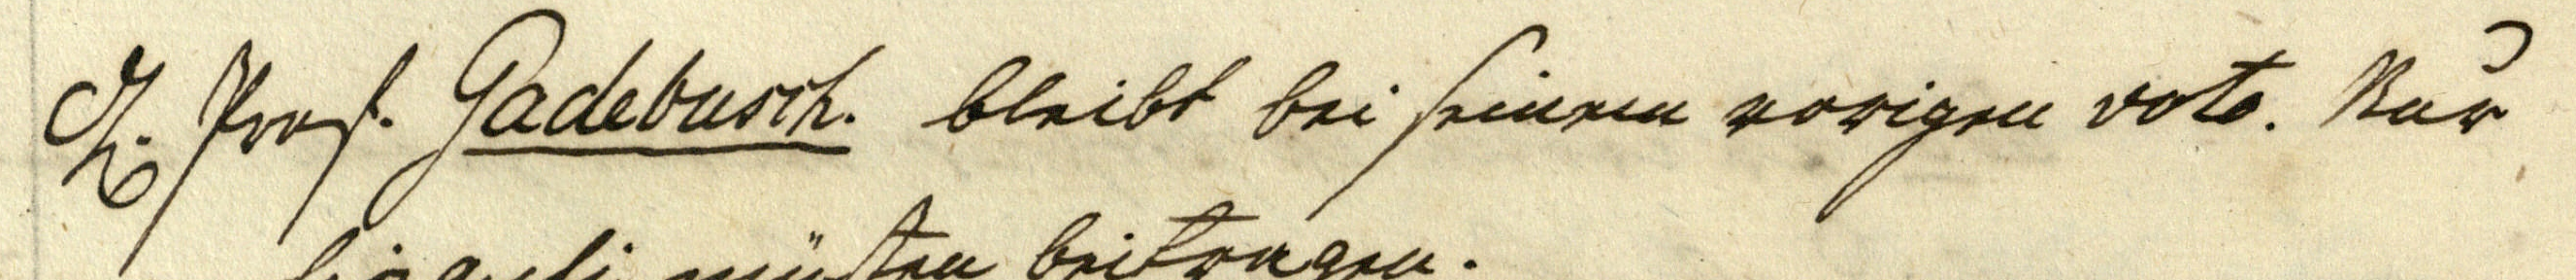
dh. Prof. Gadebusch. bleibt bei seinem vorigen voto. Nur
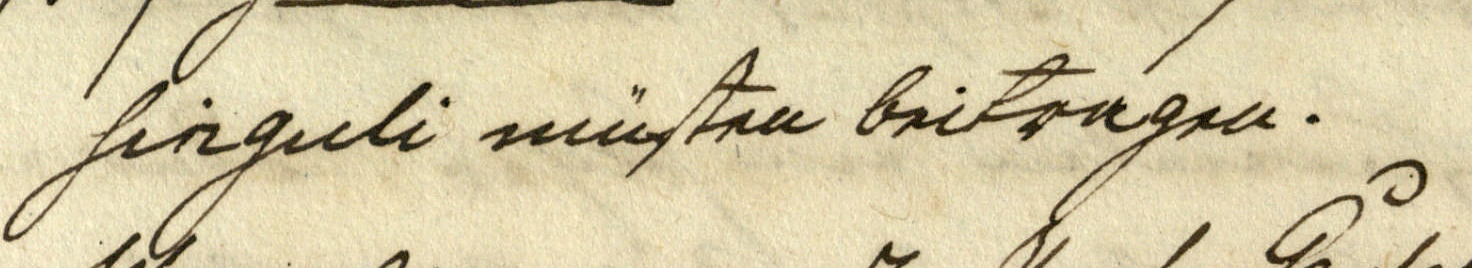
singuli müßten beitragen.
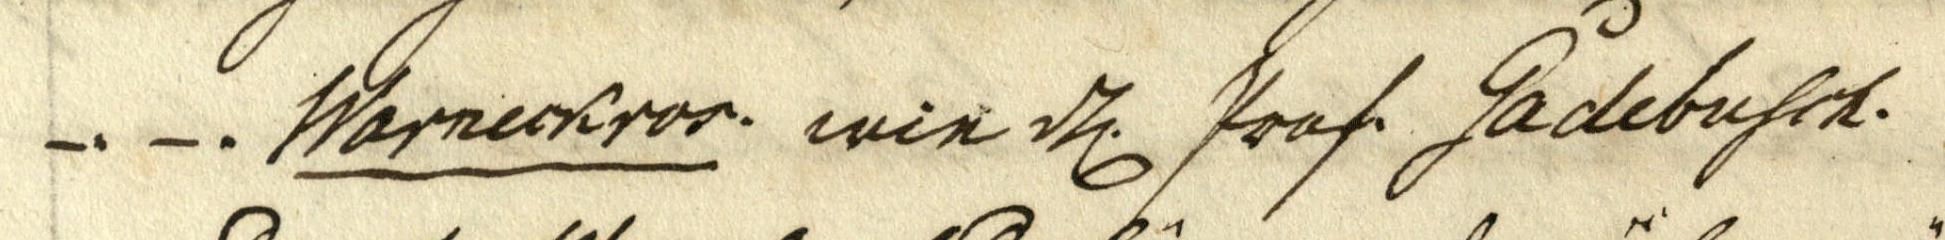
- " - " Warneckros. wie dh. Prof. Gadebusch.
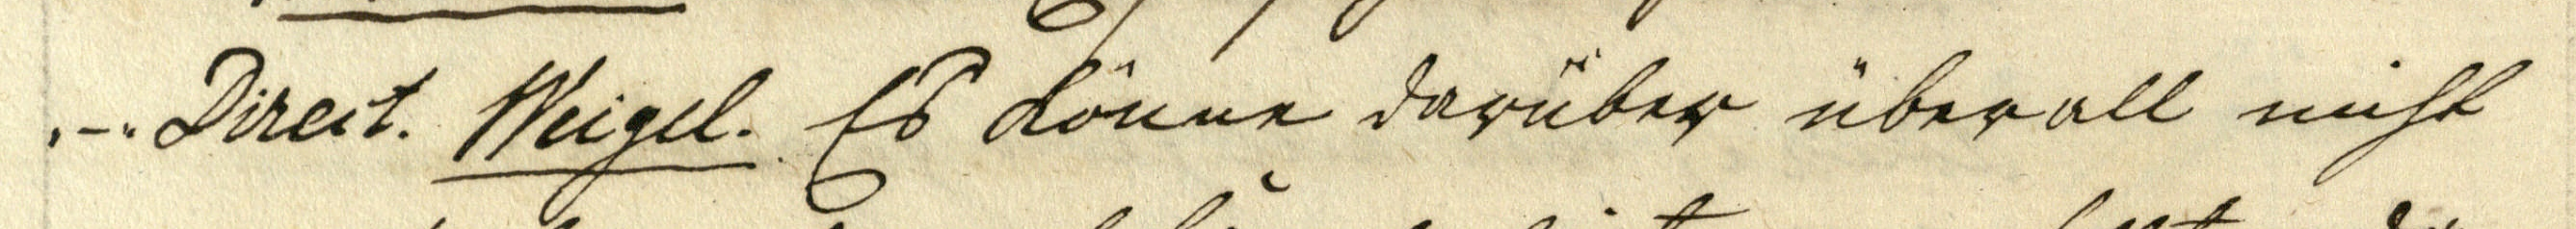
" - " Direct. Weigel. Es könne darüber überall nicht
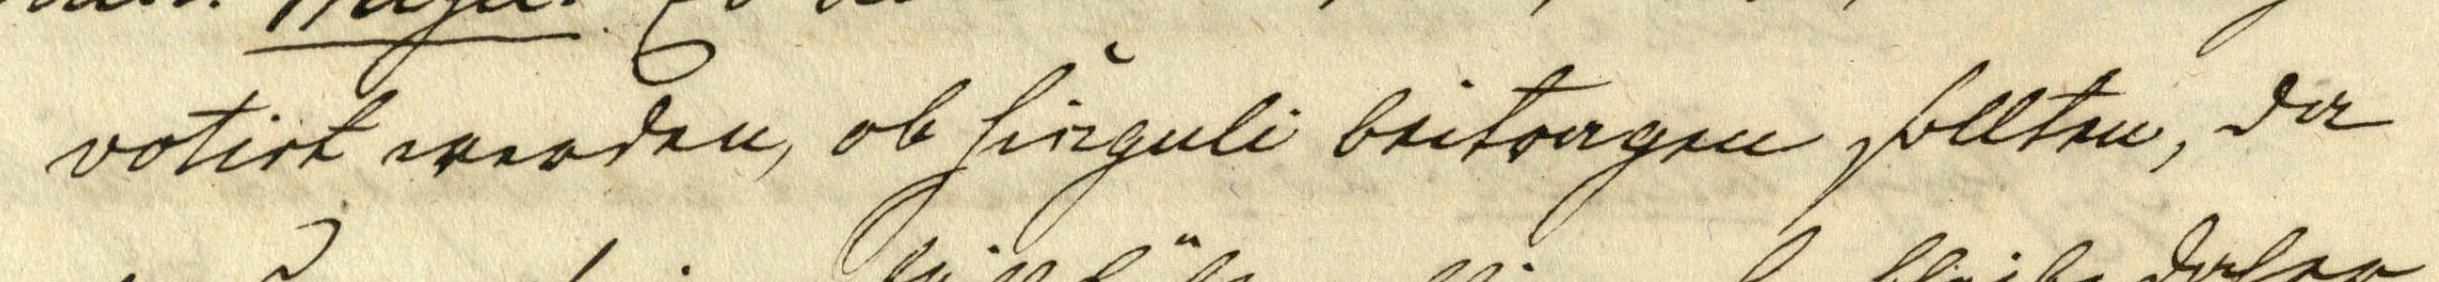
votirt werden, ob singuli beitragen sollten, da
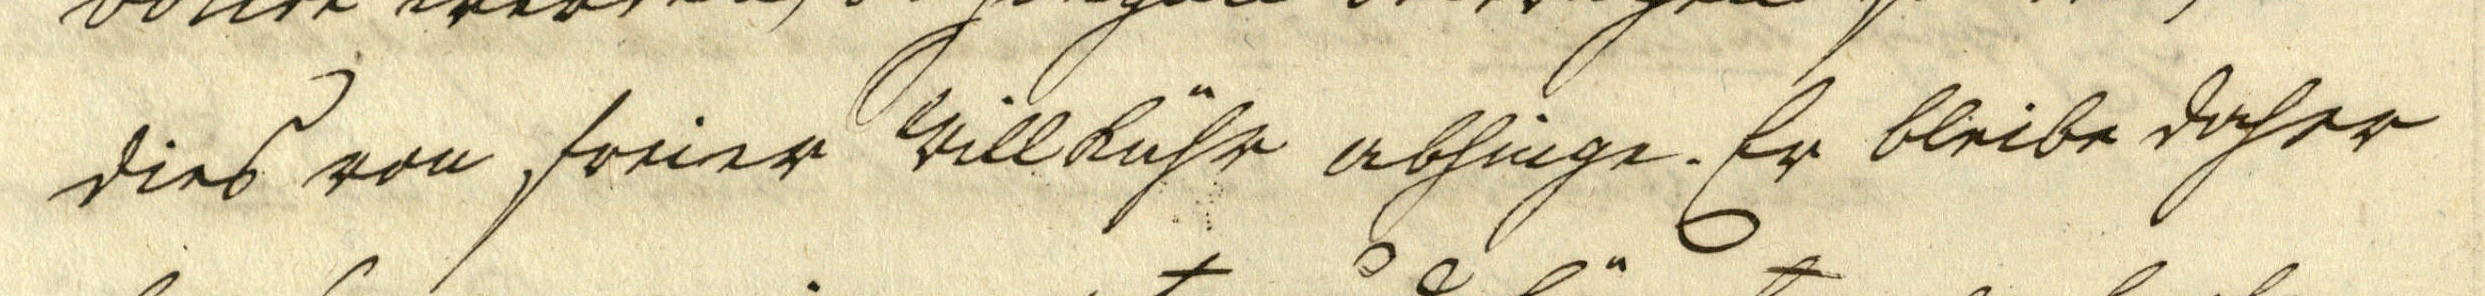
dies von seiner Willkühr abhinge. Er bleibe daher
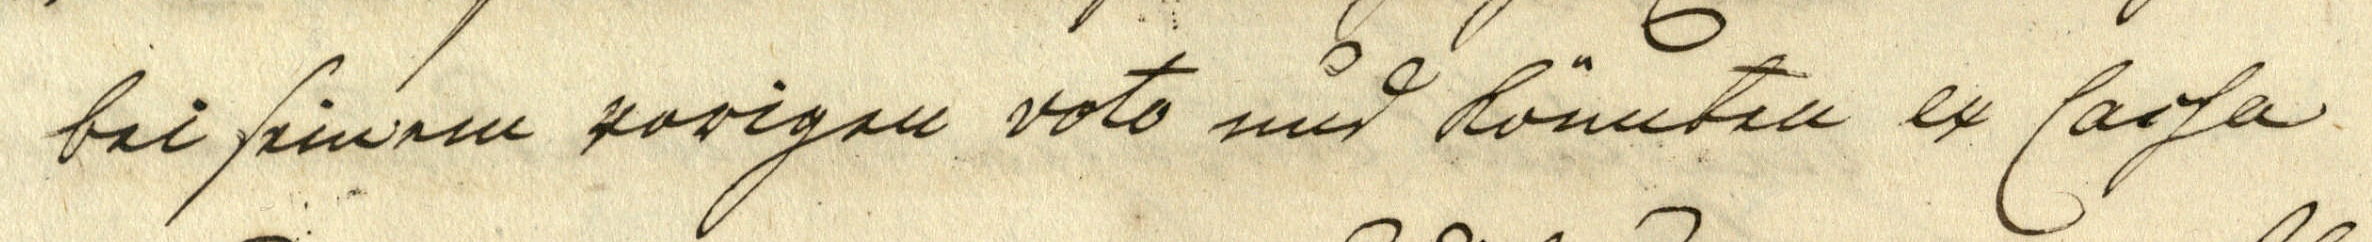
bei seinem vorigen voto und könnten ex Cassa
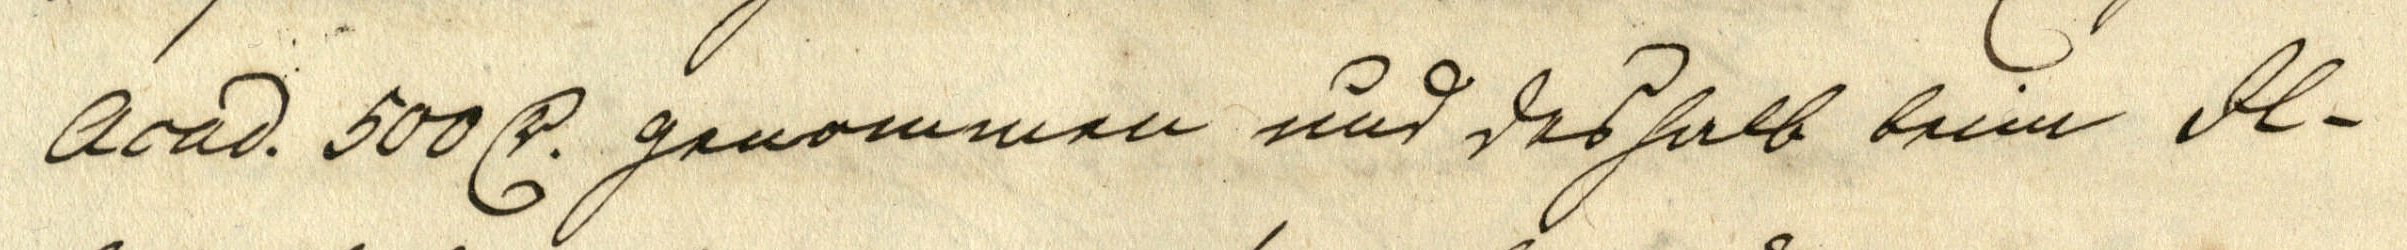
Acad. 500 rtl. genommen und deshalb beim Il-
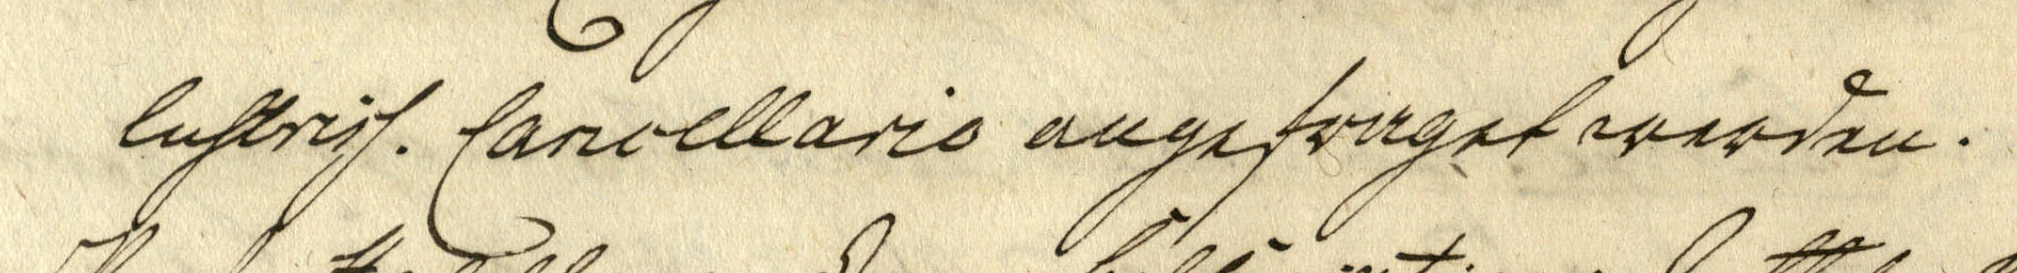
lustriss. Cancellario angefraget werden.
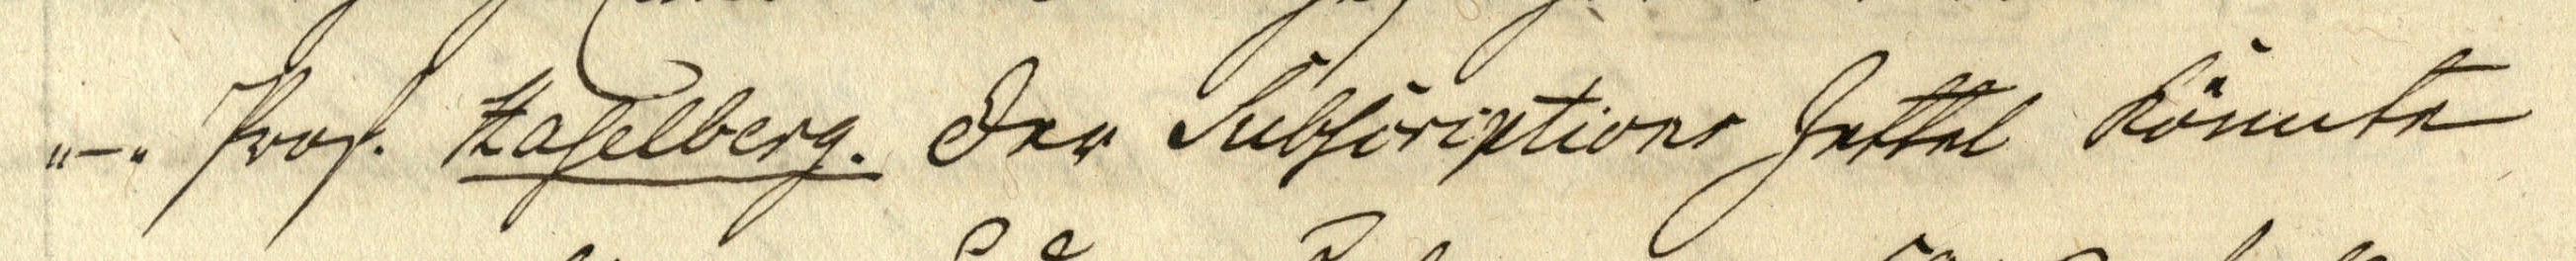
" - " Prof. Haselberg. Der Subscriptions Zettel könnte
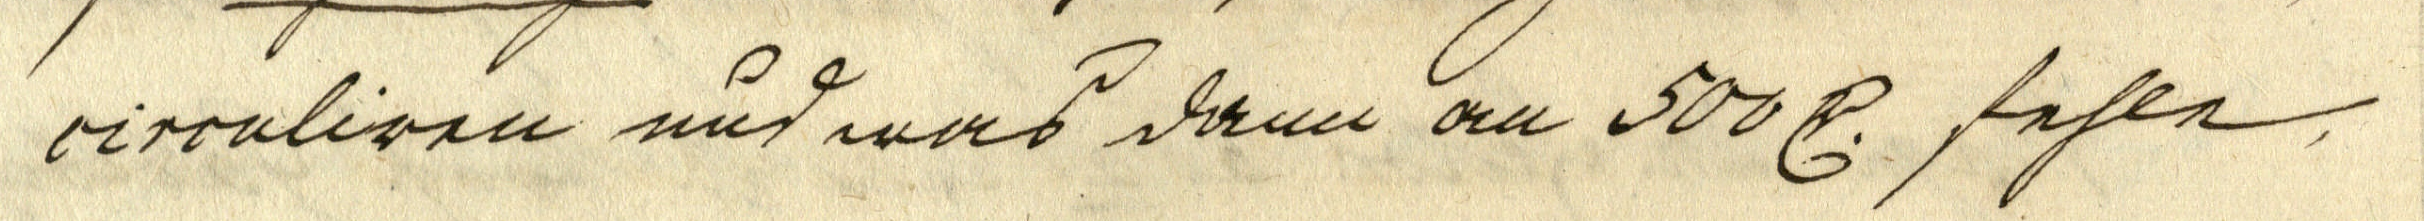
circuliren und was dann an 500 rtl. fehle,
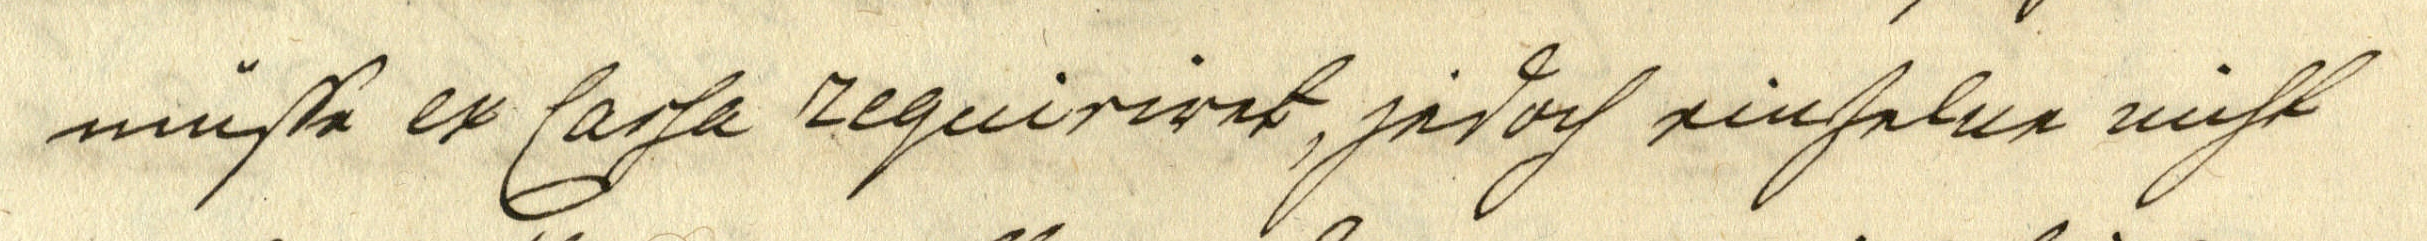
müsse ec Cassa requiriret, jedoch einzelne nicht
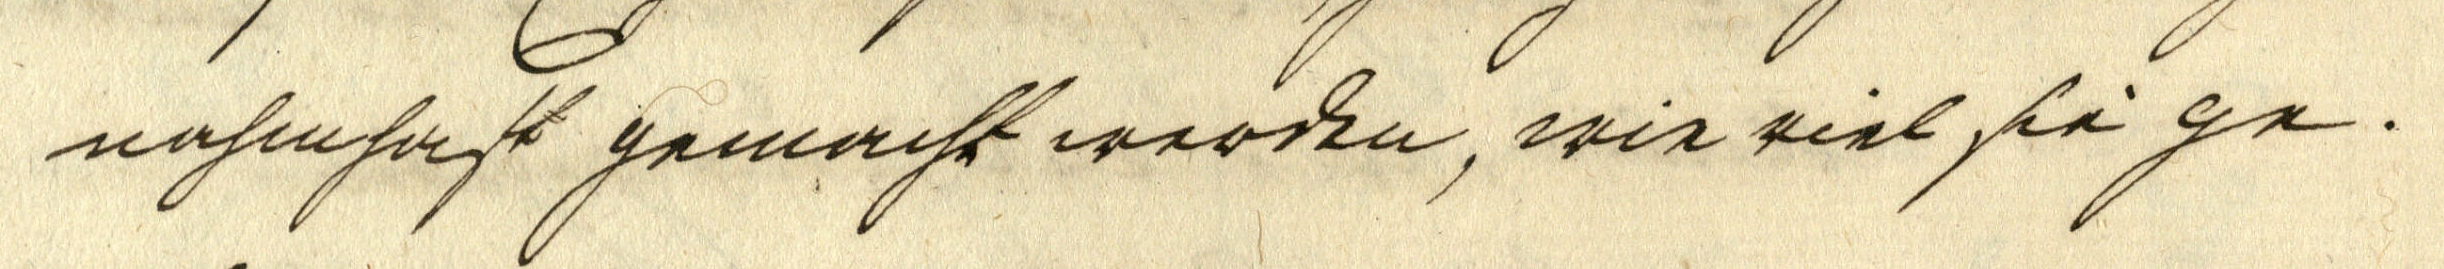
nahmhaft gemacht werden, wie viel sie ge-
